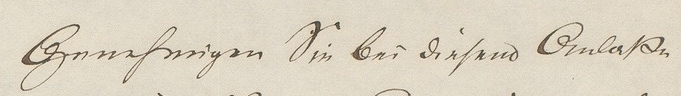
Genehmigen Sie bei diesem Anlaße
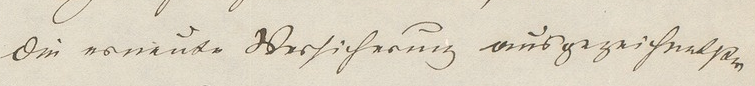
die erneute Versicherung ausgezeichnetster
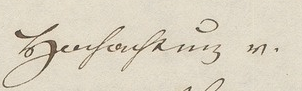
Hochachtung v.
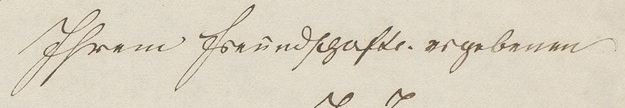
Ihrem freundschaftl. ergebenen
